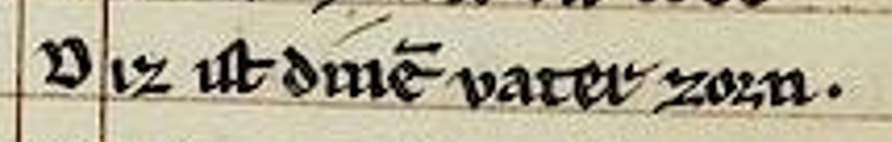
Diz iſt dine(m) vater zorn.
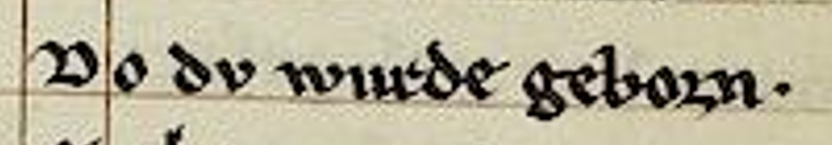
Do dv wurde geborn.
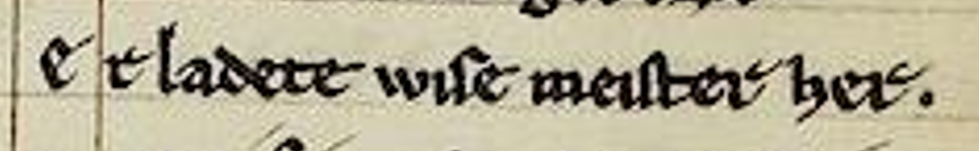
Er ladete wiſe meiſter her.
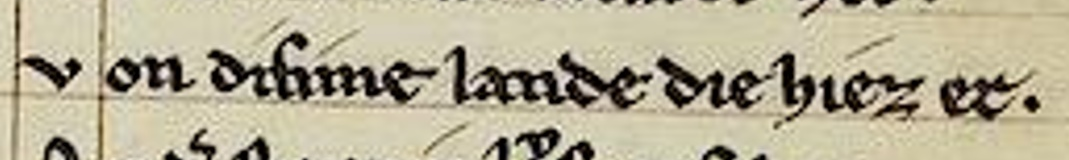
Von diſime lande die hiez er.
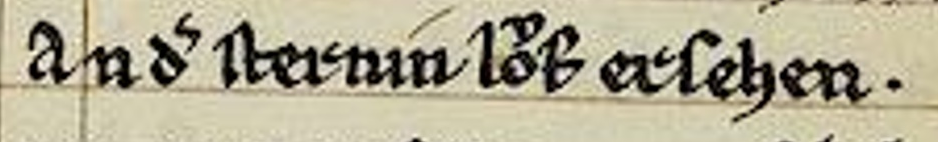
An d(er) ſternin lo°vf erſehen.
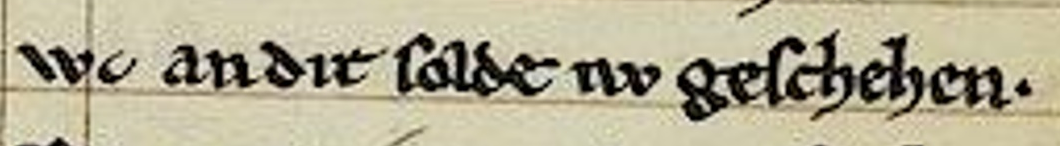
W(az) an dir ſolde nv geſchehen.
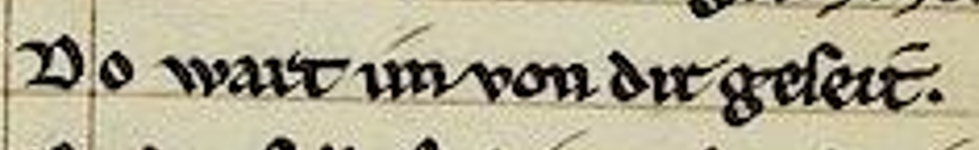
Do wart im von dir geſeit.
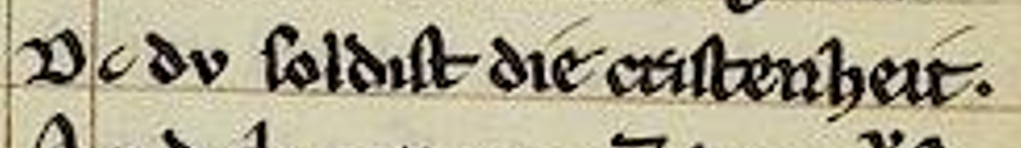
D(az) dv ſoldiſt die criſtenheit.
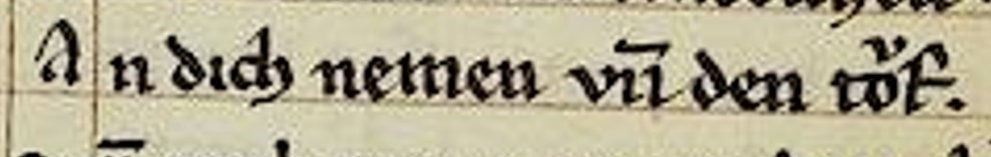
An dich nemen vn(d) den to°vf.
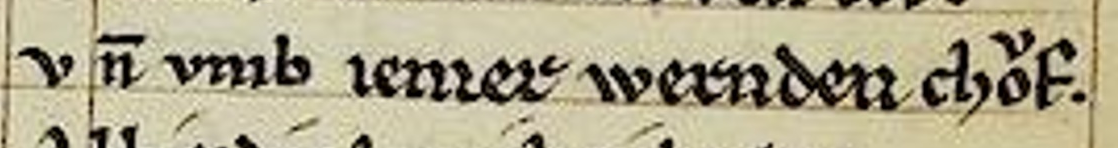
Vn(d) vmb iemer wernden cho°vf.
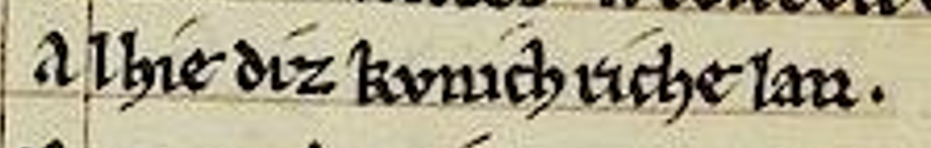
Alhie diz kvnich riche lan.
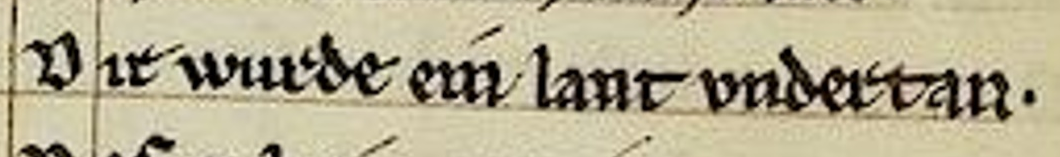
Dir wurde ein lant vndertan.
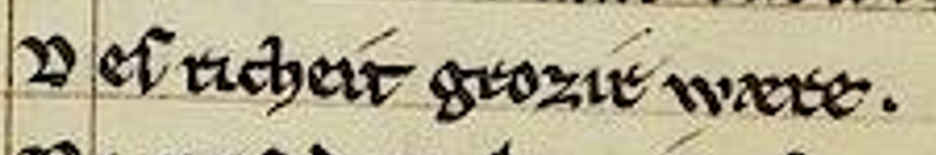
Deſ richeit grozir w[ae]re.
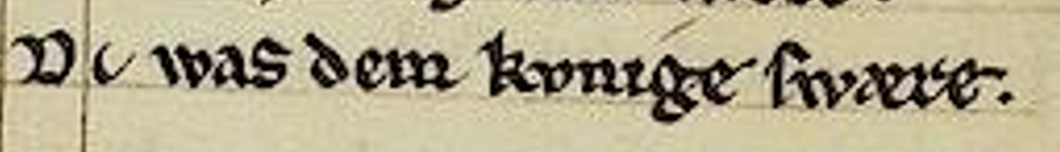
D(az) was dem kvnige ſw[ae]re.
